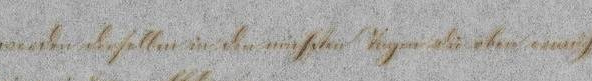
werden derselben in den nächsten Tagen die oben erwähnten
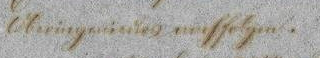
Oberingenieurs nachfolgen.
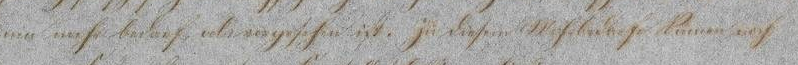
lionen mehr bedarf, als vorgesehen ist. Zu diesem Mehrbedarfe kämen noch
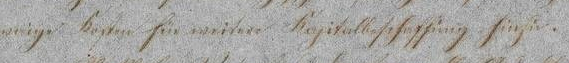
etwaige Kosten für weitere Kapitalbeschaffung hinzu.
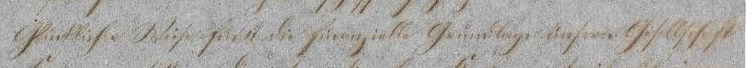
Glücklicher Weise fußt die finanzielle Grundlage unserer Gesellschaft
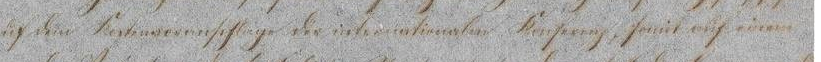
auf dem Kostenvoranschlage der internationalen Konferenz, somit auf einem
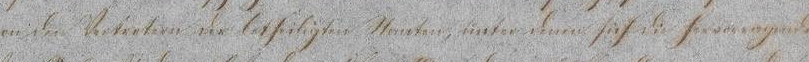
von den Vertretern der betheiligten Staaten, unter denen sich die hervorragend-
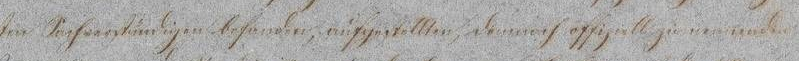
sten Sachverständigen befanden, aufgestellten, demnach offiziell zu nehmenden
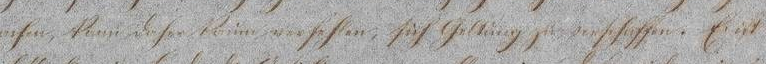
machen, kann daher kaum verfehlen, sich Geltung zu verschaffen. Es ist
